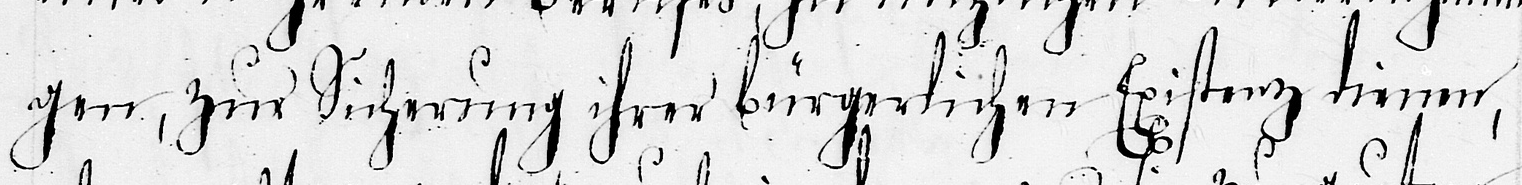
gen, zur Sicherung ihrer bürgerlichen Existenz dienen,
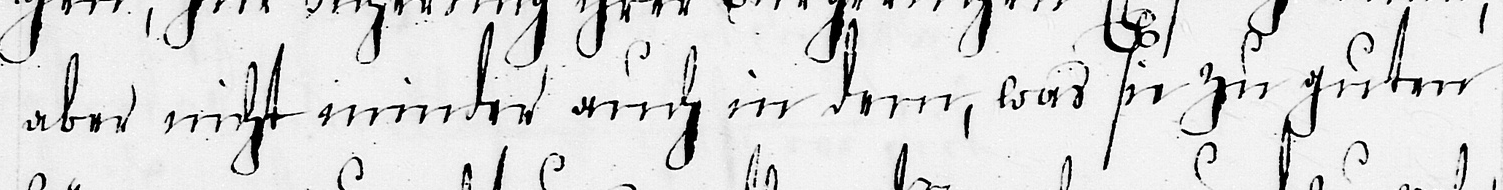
aber nicht minder auch in dem, was sie zu guten
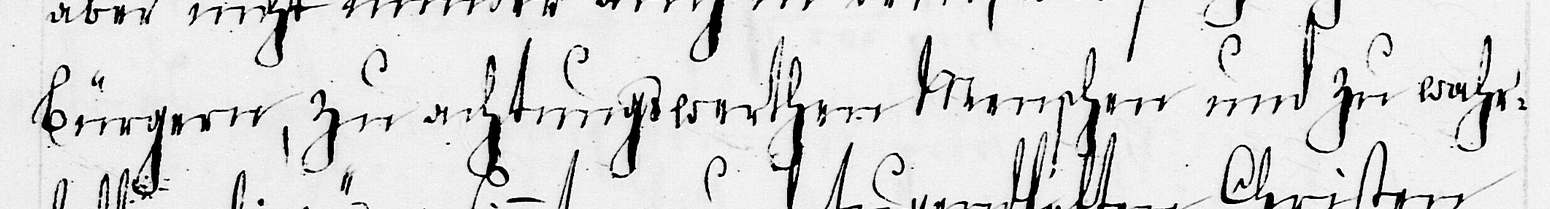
Bürgern, zu achtungswerthen Menschen und zu wahr¬
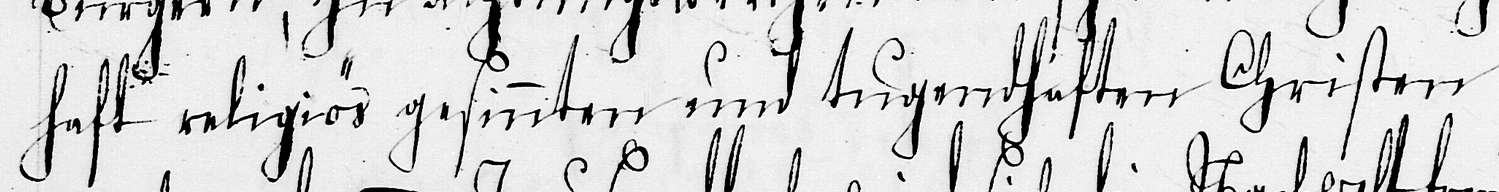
haft religiös gesinnten und tugendhaften Christen
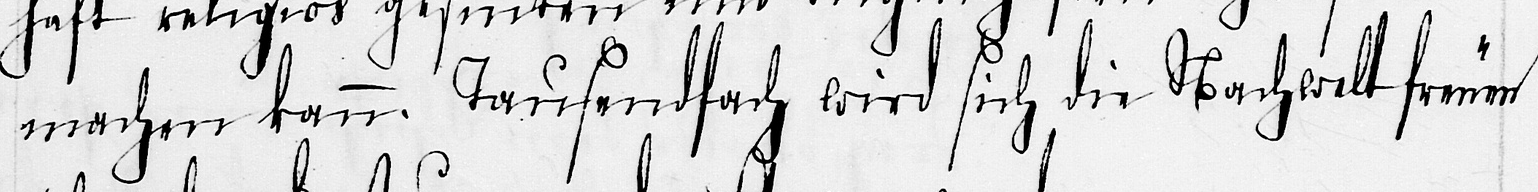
machen kann. Tausendfach wird sich die Nachwelt freuen
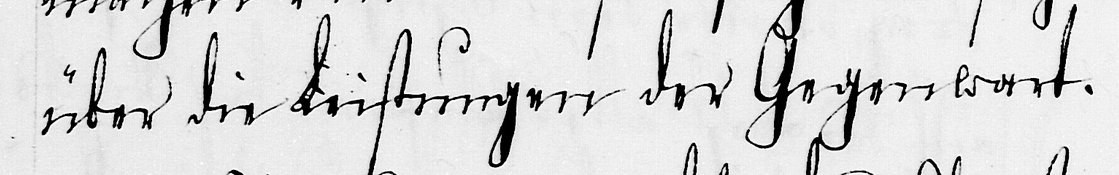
über die Leistungen der Gegenwart.
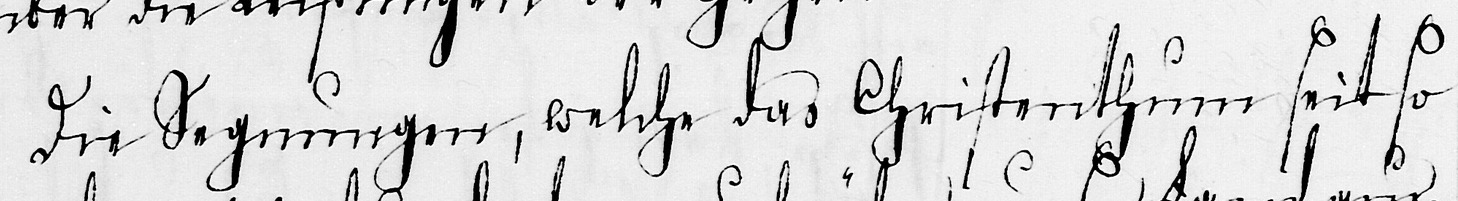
Die Segnungen, welche das Christenthum seit so
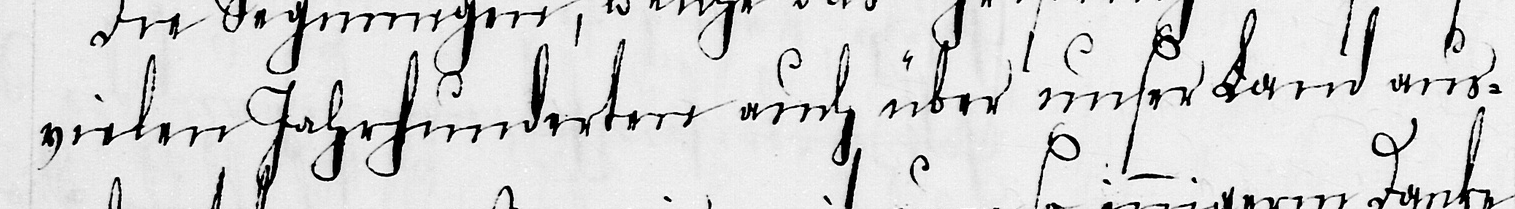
vielen Jahrhunderten auch über unser Land aus¬
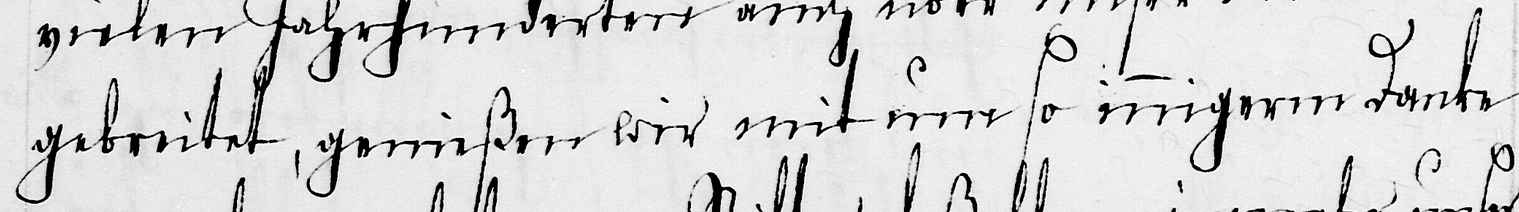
gebreitet, genießen wir mit um so innigerm Danke
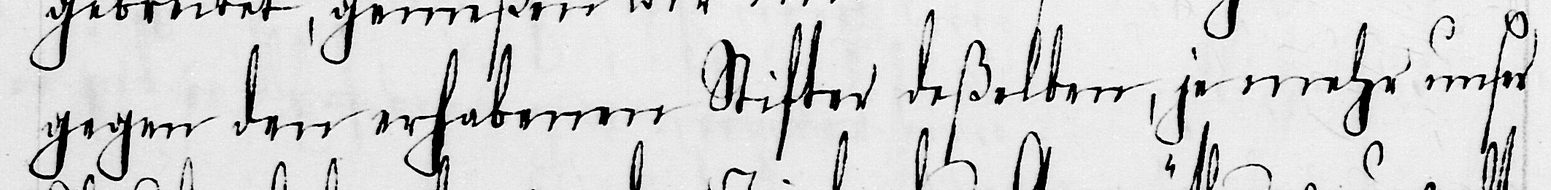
gegen den erhabenen Stifter deßelben, je mehr unser
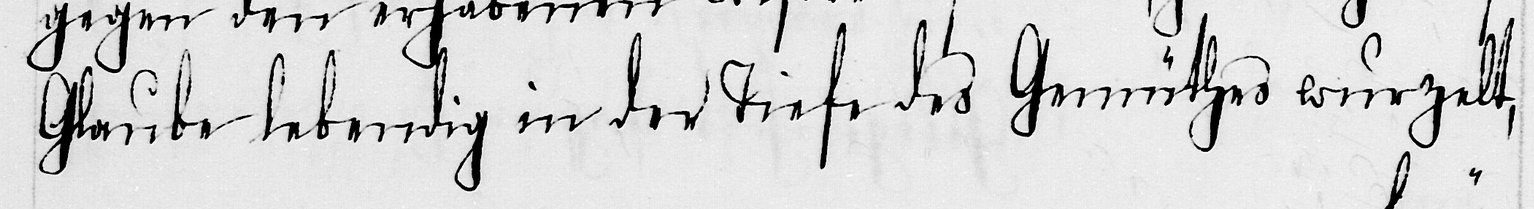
Glaube lebendig in der Tiefe des Gemüthes wurzelt,
